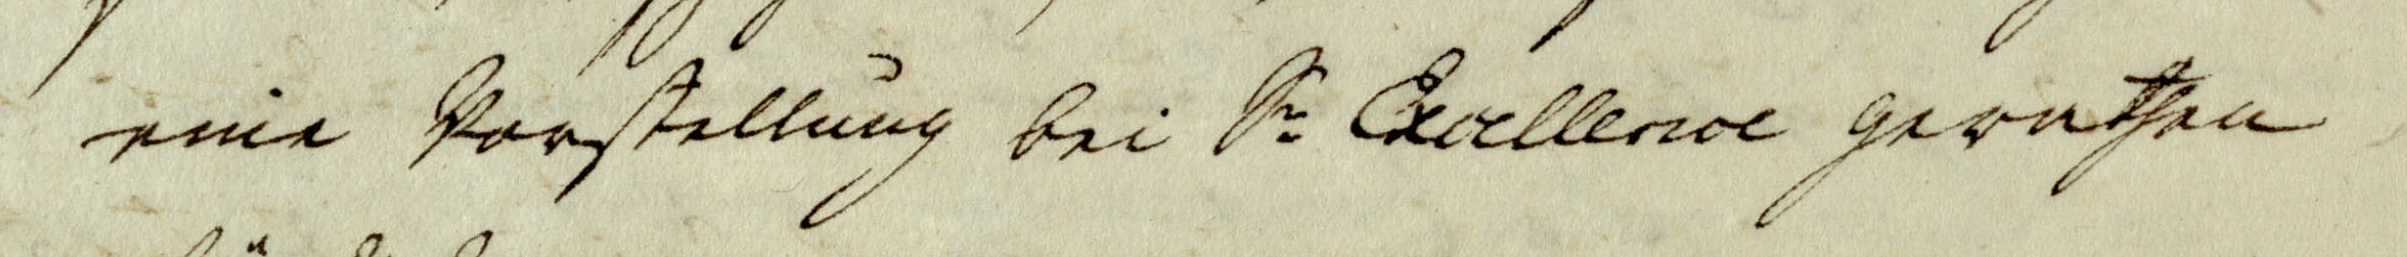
eine Vorstellung bei Sr Excellence gerathen
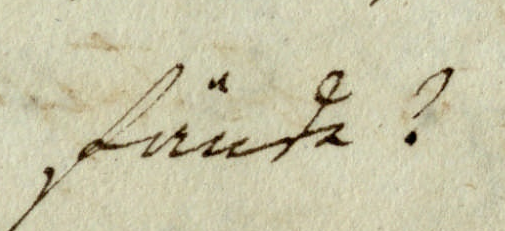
fände?
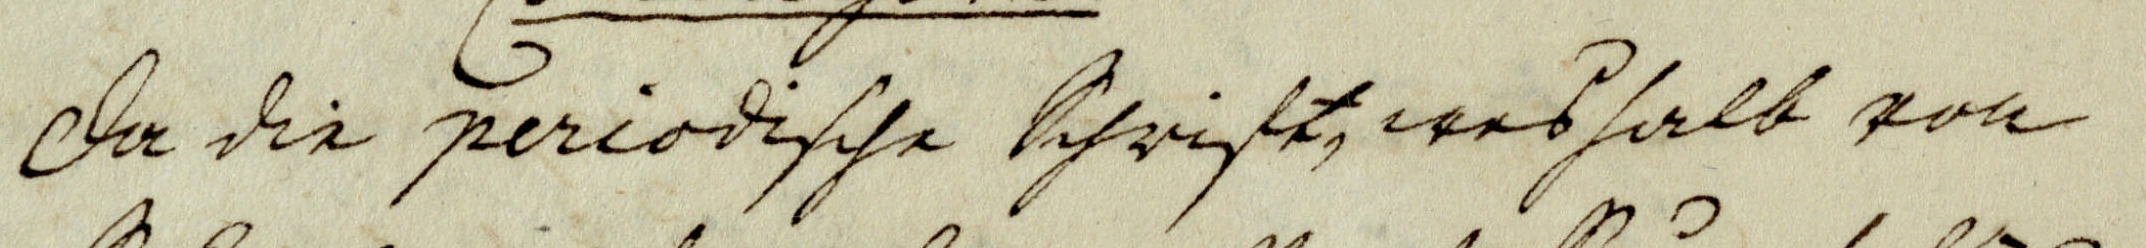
Da die periodische Schrift, weshalb von
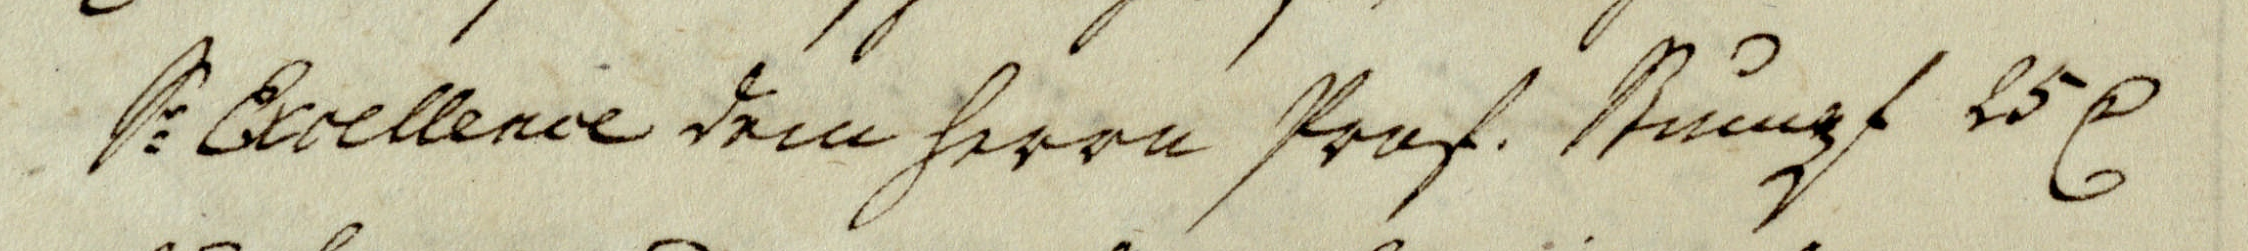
Sr Excellence dem Herrn Prof. Stumpf 25 l.
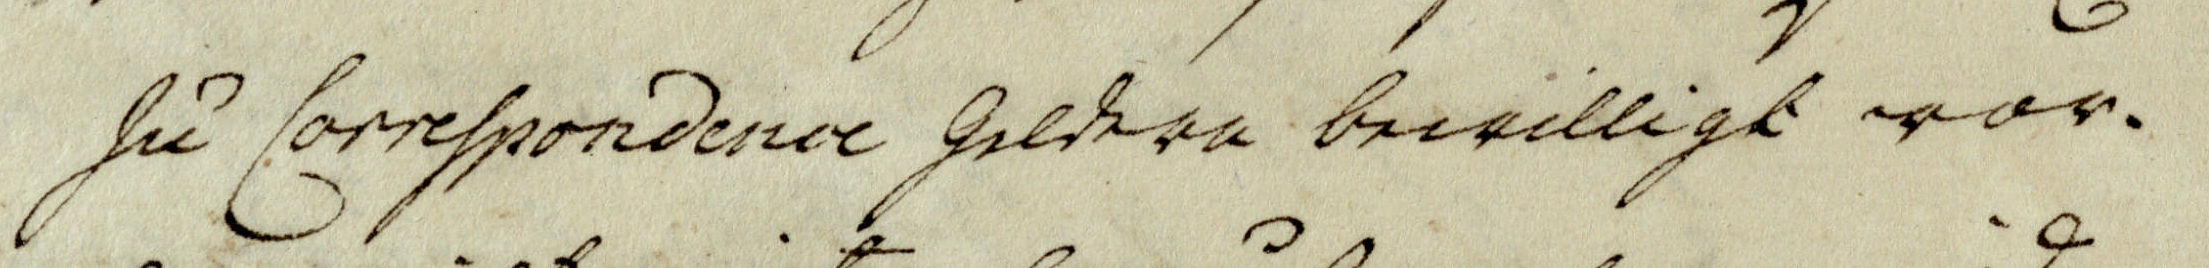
zu Connspondence Geldern bewilligt wor¬
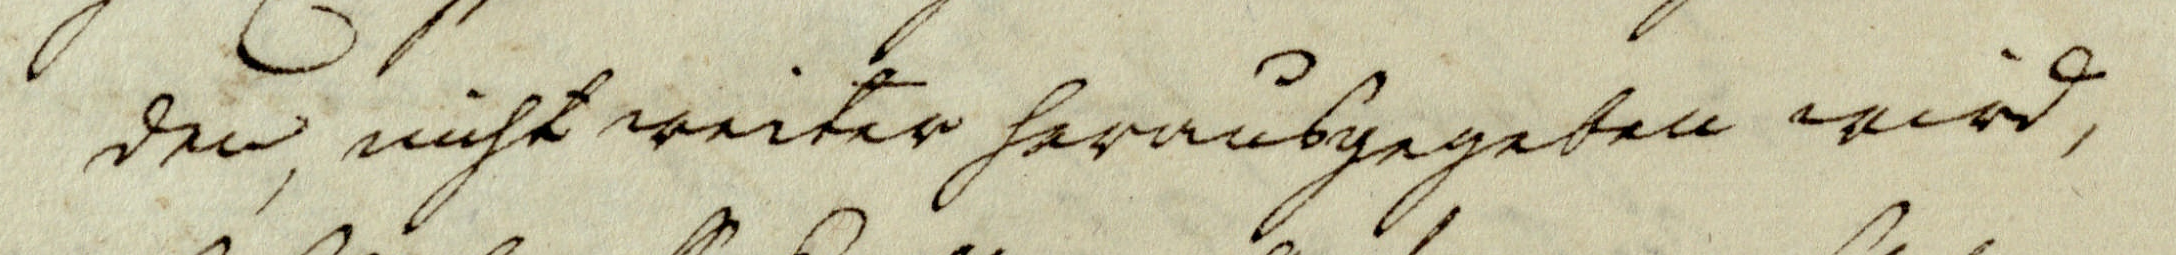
den nicht weiter herausgegeben wird,
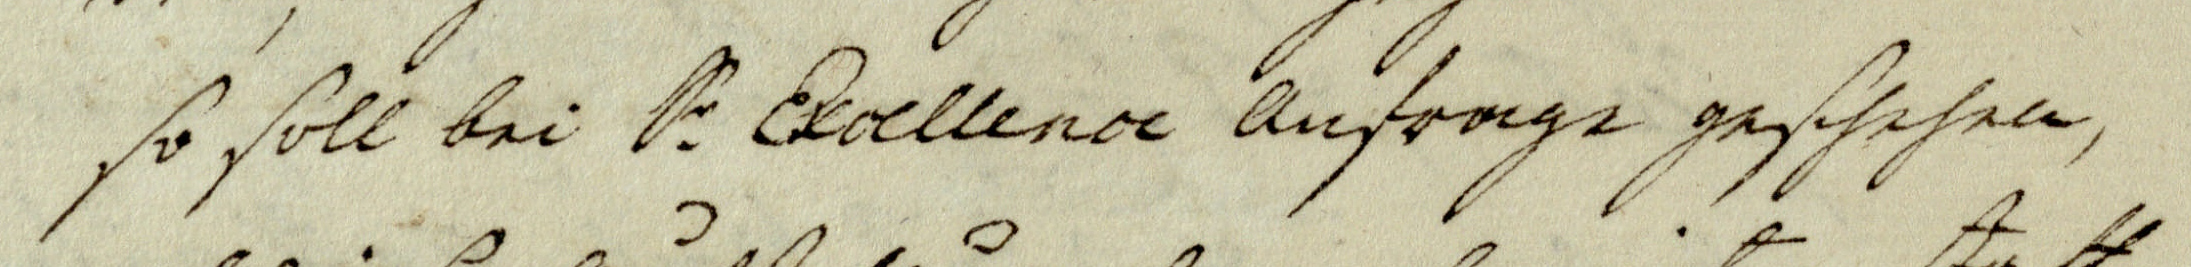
so soll bei Sr Excellence Anfrage geschehen,
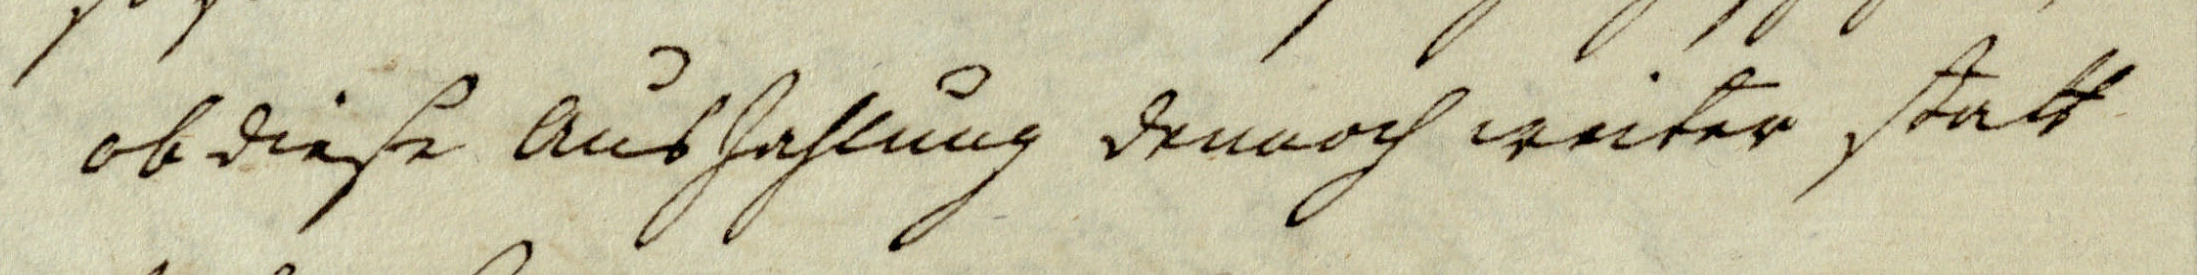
ob diese Auszahlung dennoch weiter statt
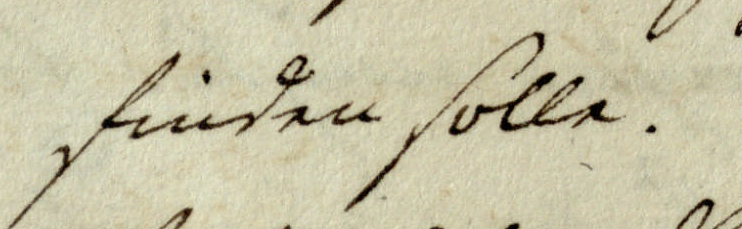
finden solle.
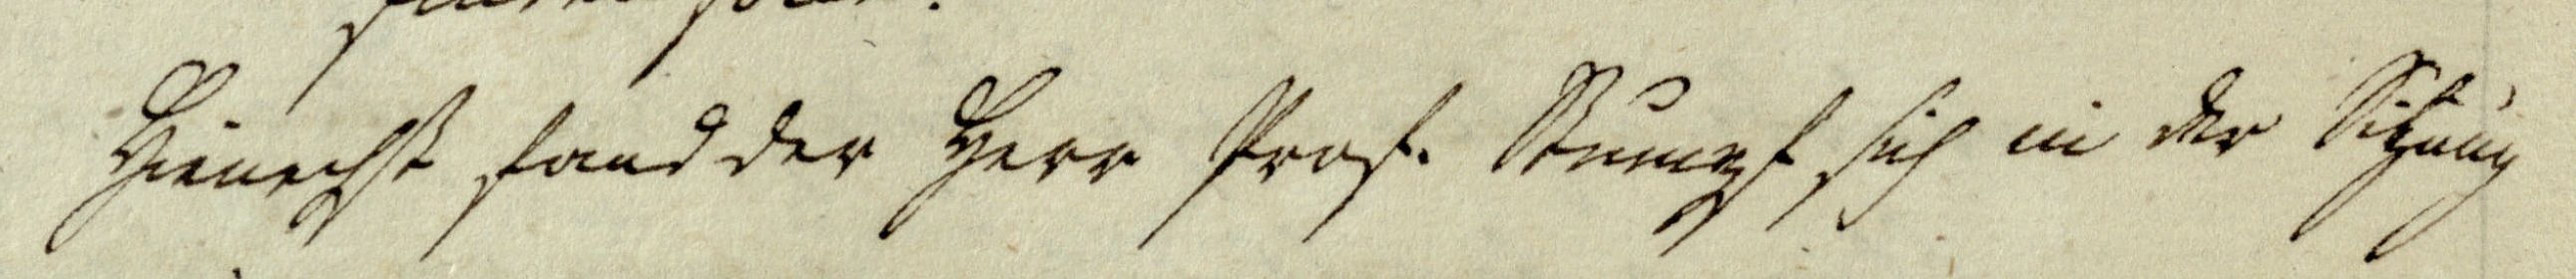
Hienechst fand der Herr Prof. Stumpf sich in der Sitzung
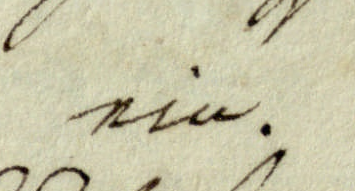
ein.
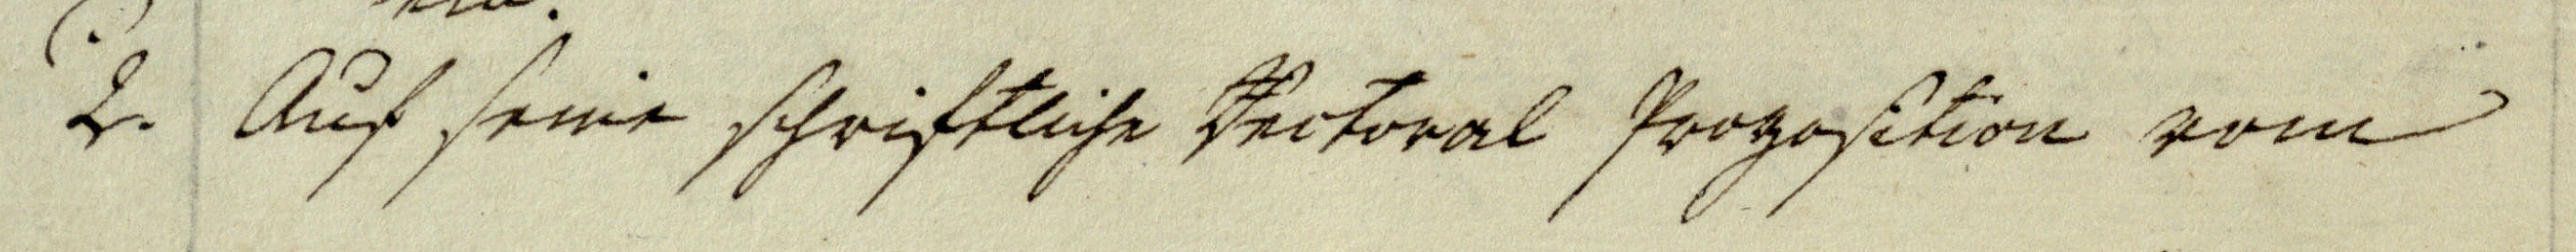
2. Auf seine schriftliche Rectoral Proposition vom
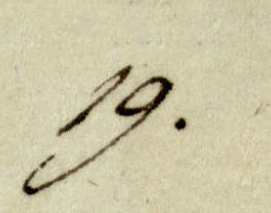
19.
